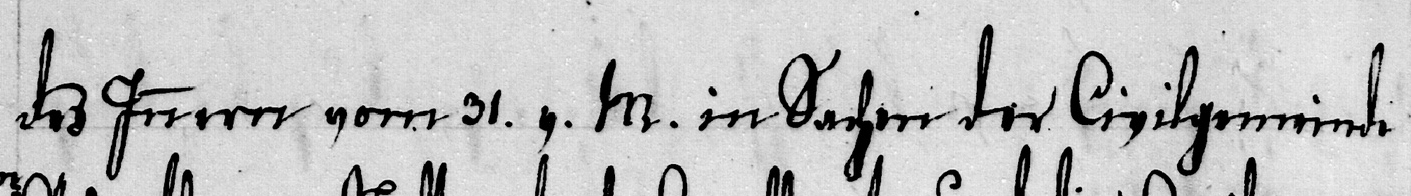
des Innern vom 31. v. M. in Sachen der Civilgemeinde
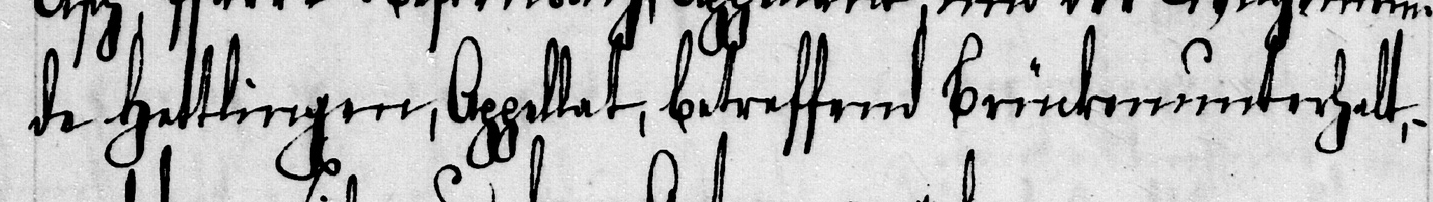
nde Hettlingen, Appellat, betreffend Brückenunterhalt,
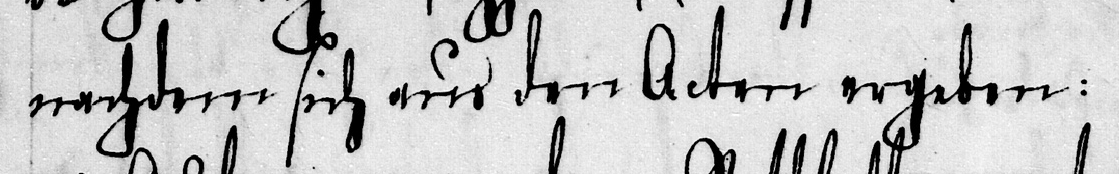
nachdem sich aus den Acten ergeben:
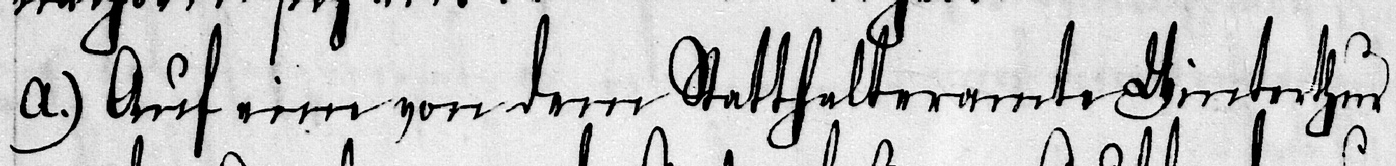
A.) Auf eine von dem Statthalteramte Winterthur
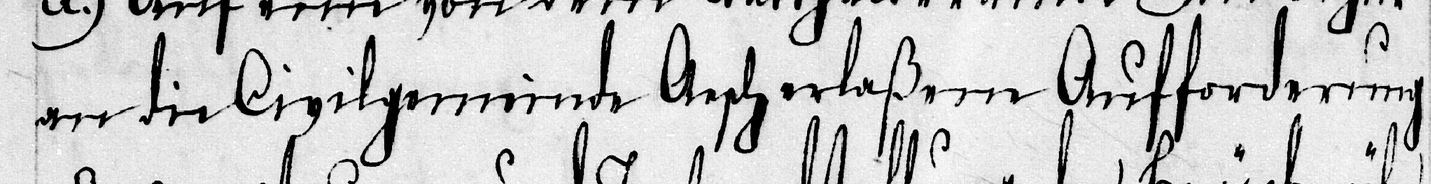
an die Civilgemeinde Aesch erlaßene Aufforderung
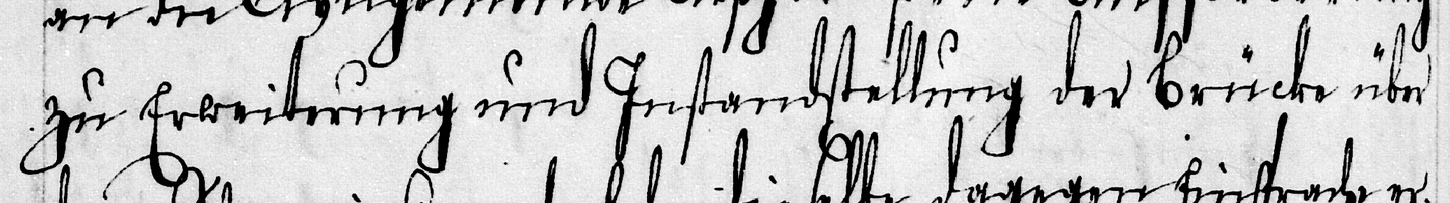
zu Erweiterung und Instandstellung der Brücke über
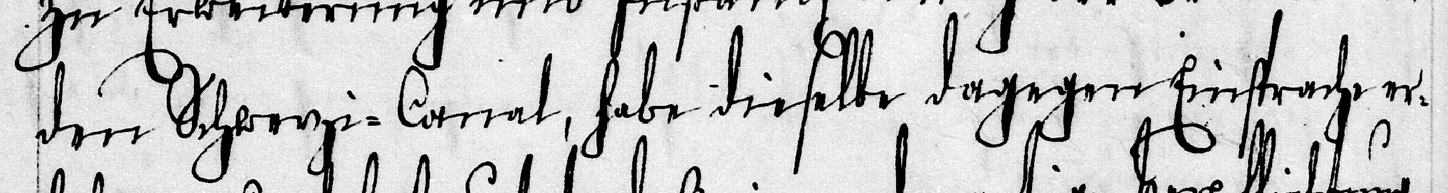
den Schwerzi-Canal, habe dieselbe dagegen Einsprache er¬
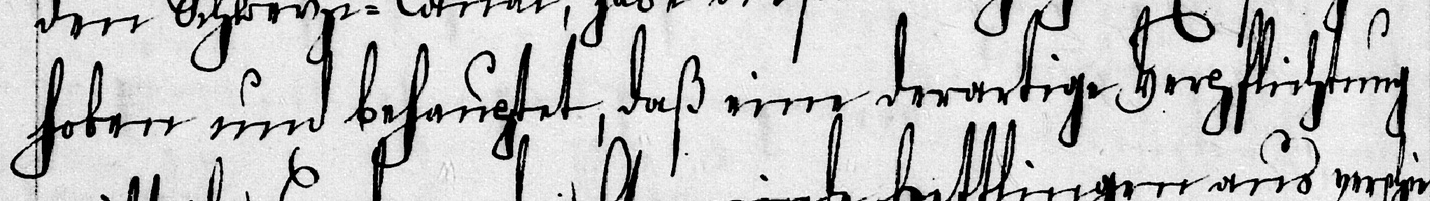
hoben und behauptet, daß eine derartige Verpflichtung
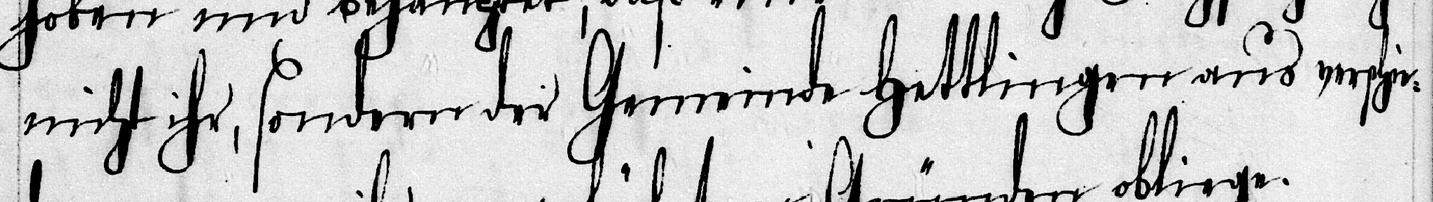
nicht ihr, sondern der Gemeinde Hettlingen aus ve¬
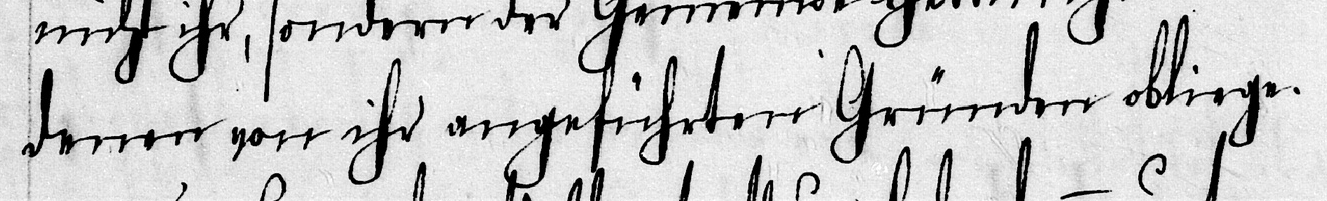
denen von ihr angeführten Gründen obliege.
